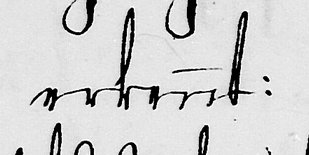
erkennt:
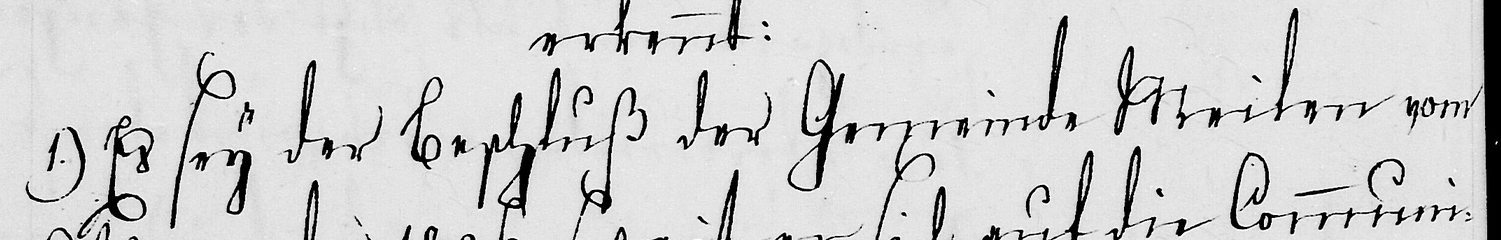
1.) Es sey der Beschluß der Gemeinde Meilen vom
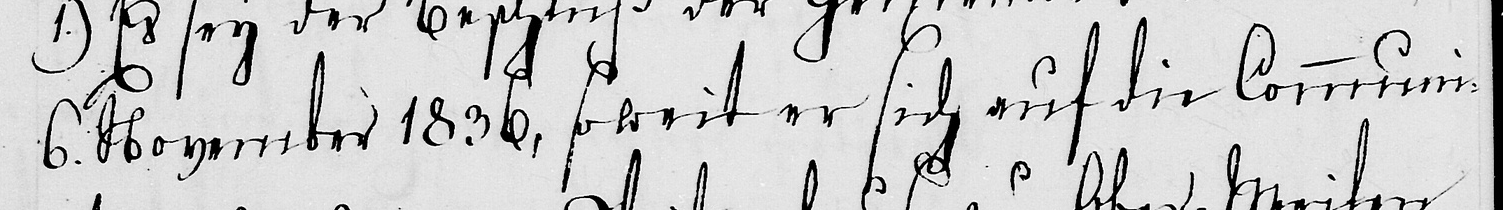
6. November 1836, soweit er sich auf die Communi¬
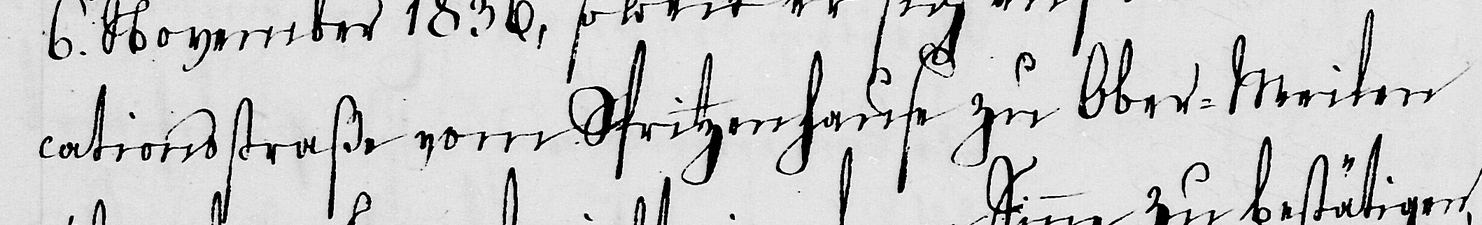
cationsstraße vom Spritzenhause zu Ober-Meilen
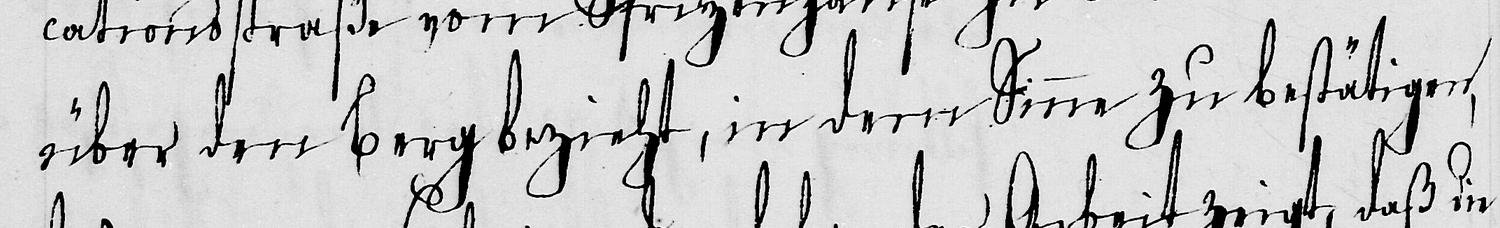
über den Berg bezieht, in dem Sinne zu bestätigen,
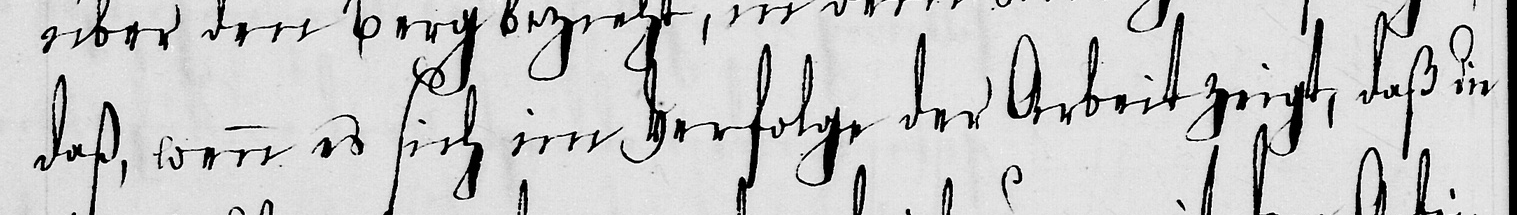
daß, wenn es sich im Verfolge der Arbeit zeigt, daß die
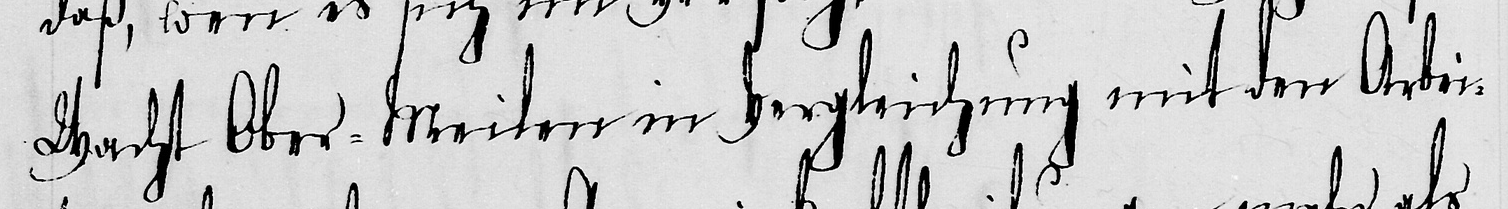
Wacht Ober-Meilen in Vergleichung mit den Arbei¬
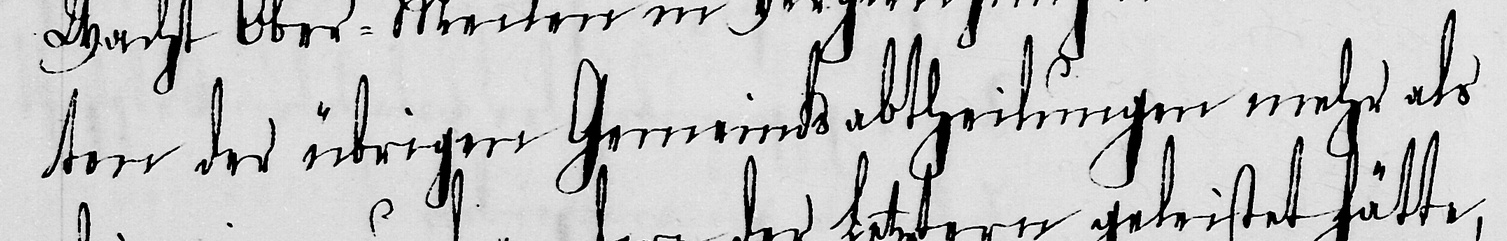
ten der übrigen Gemeindsabtheilungen mehr als
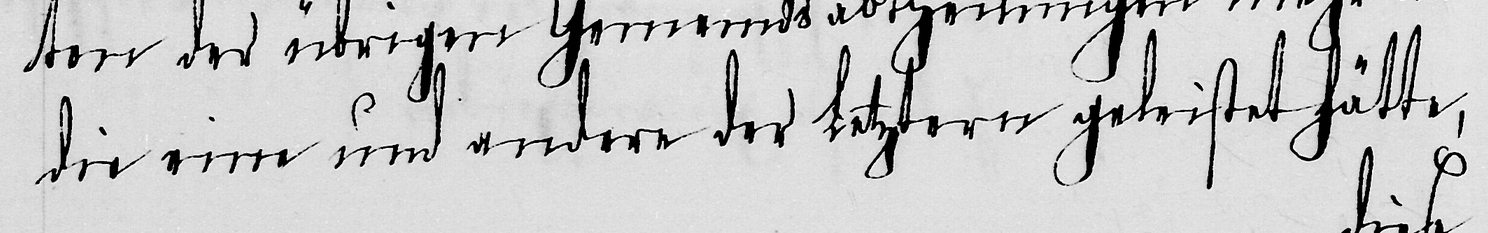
die eine und andere der Letztern geleistet hätte,
